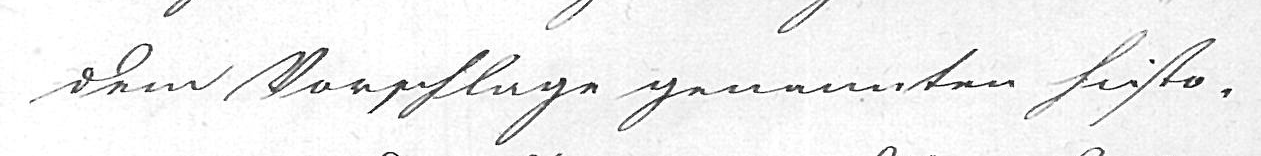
dem Vorschlage genannten histo-
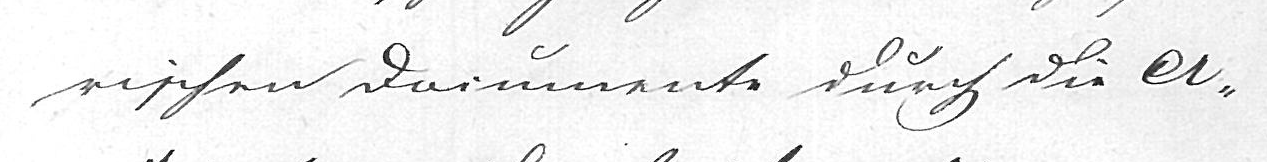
rischen Documente durch die A-
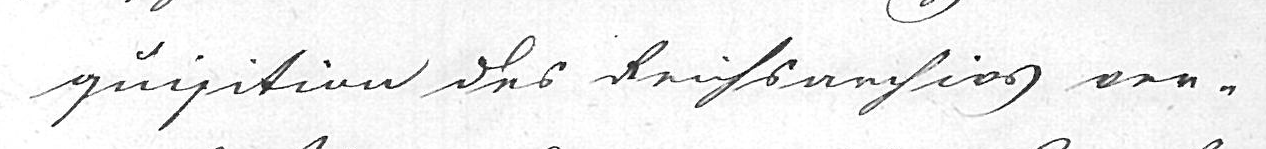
quisition des Reichsarchivs ver-
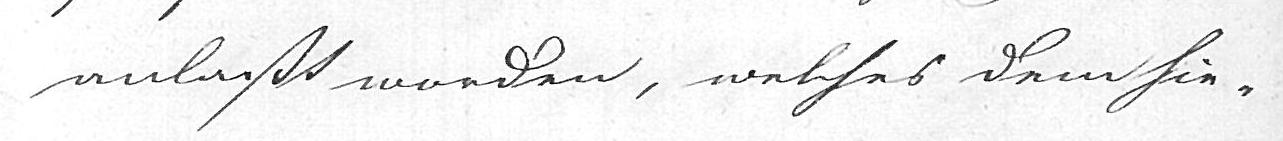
anlaßt worden, welches dem hie-
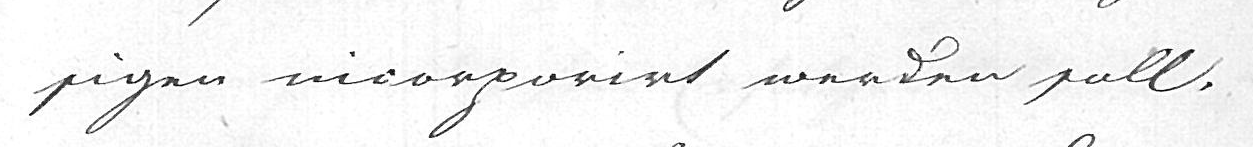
sigen incorporirt werden soll.
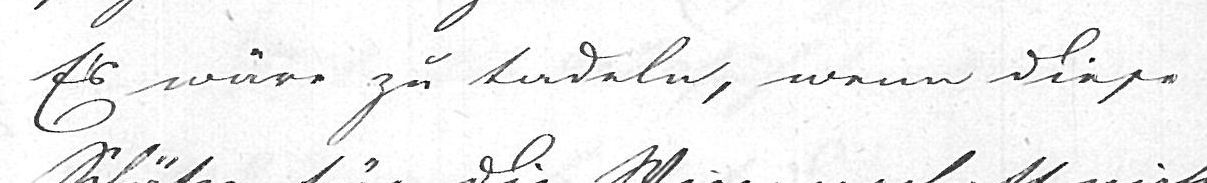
Es wäre zu tadeln, wenn diese
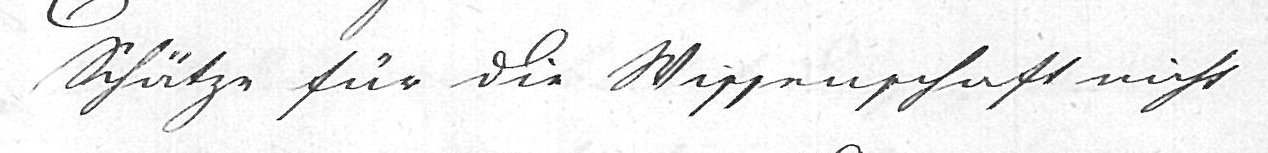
Schätze für die Wissenschaft nicht
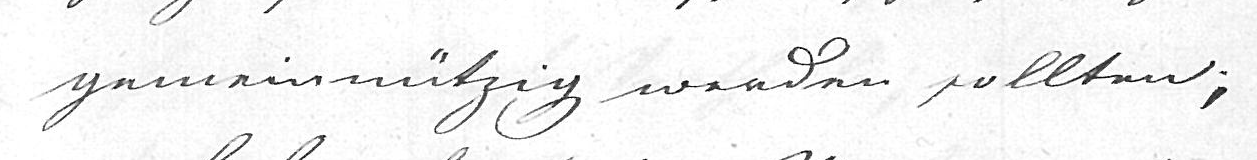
gemeinnützig werden sollten;
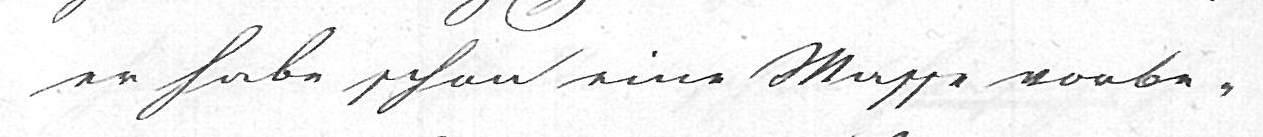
er habe schon eine Masse vorbe-
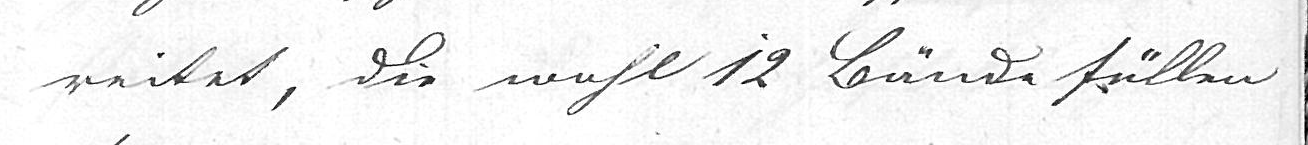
reitet, die wohl 12 Bände füllen
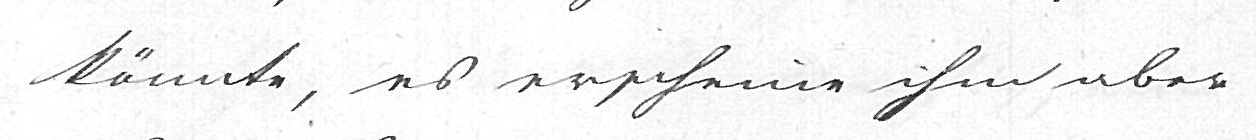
könnte, es erscheine ihm aber
